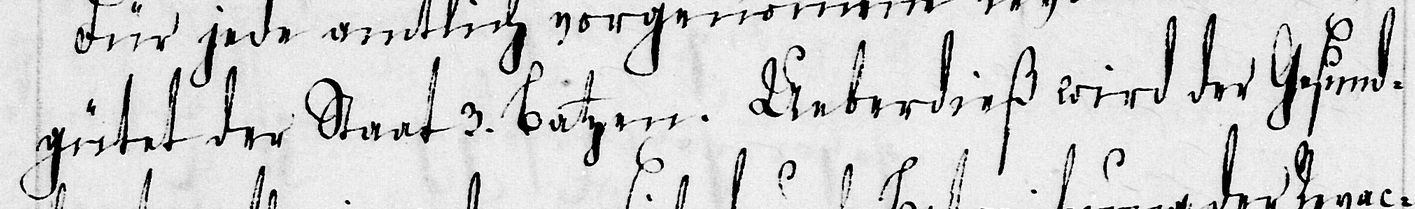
gütet der Staat 3. Batzen. Ueberdieß wird der Gesun¬
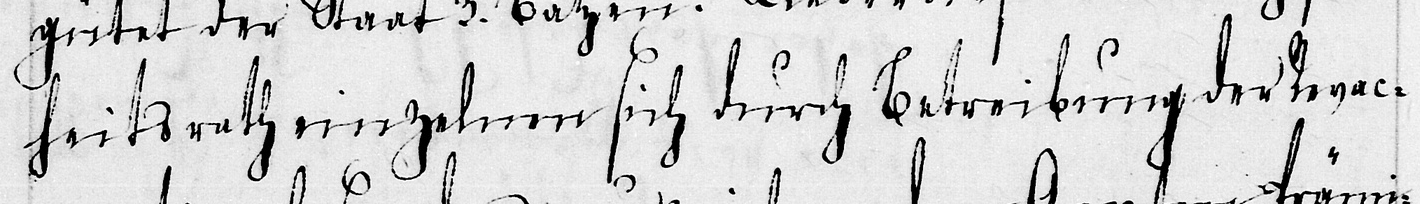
dheitsrath einzelnen sich durch Betreibung der Revac¬
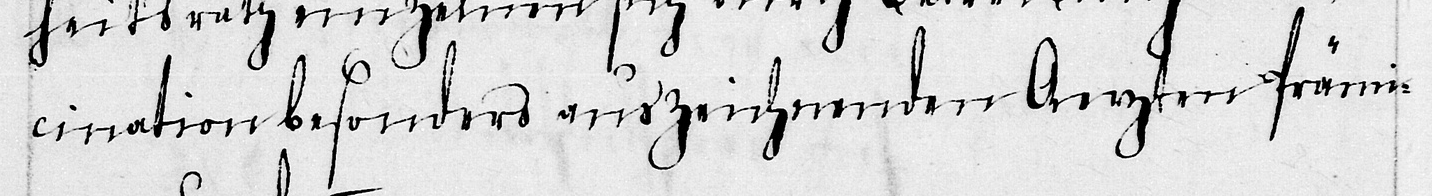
cination besonders auszeichnenden Aerzten Prämi¬
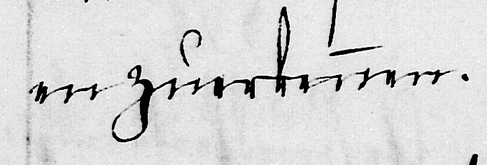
en zuerkennen.
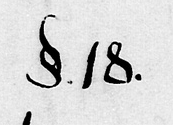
§. 18.
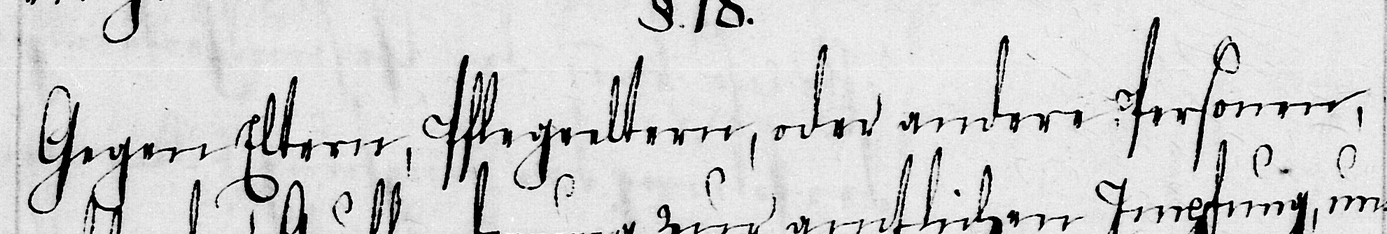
Gegen Eltern, Pflegeltern, oder andere Personen,
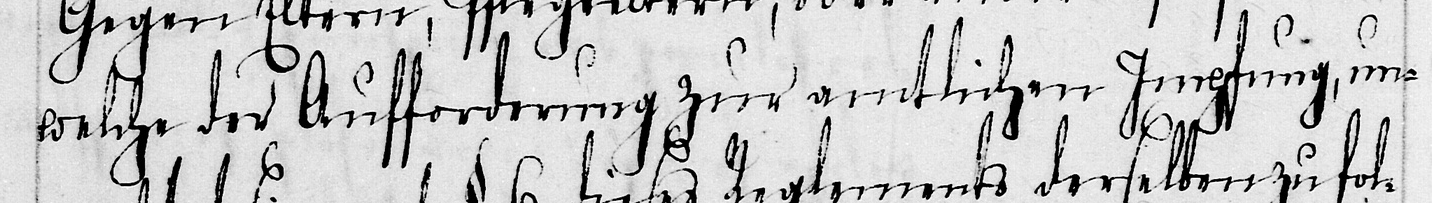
welche der Aufforderung zur amtlichen Impfung, un¬
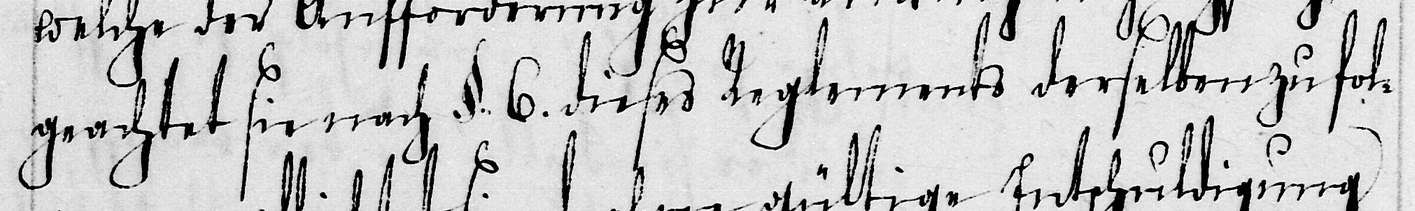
geachtet sie nach §. 6. dieses Reglements derselben zu fol¬
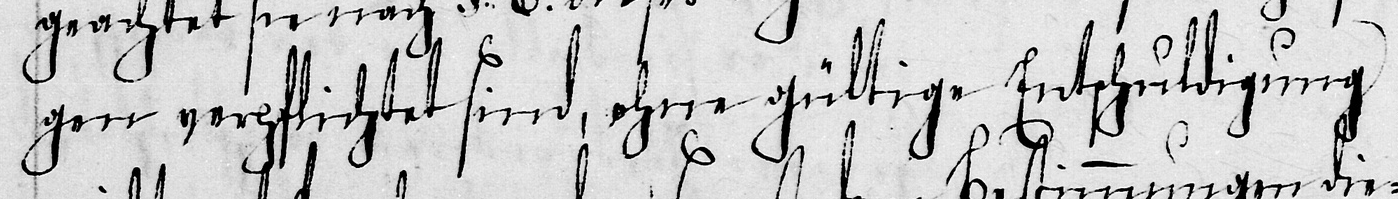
gen verpflichtet sind, ohne gültige Entschuldigung
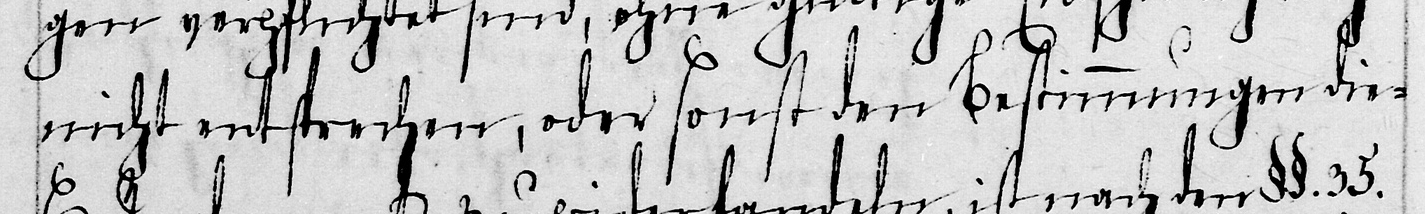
nicht entsprechen, oder sonst den Bestimmungen die¬
